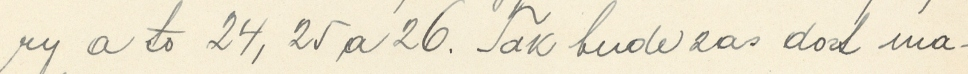ry a to 24, 25 a 26. Tak bude zas dost ma-
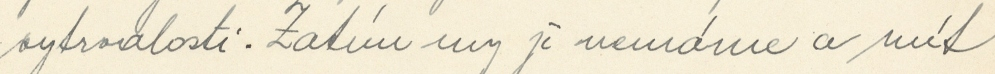vytrvalosti. Zatím my ji nemáme a mít
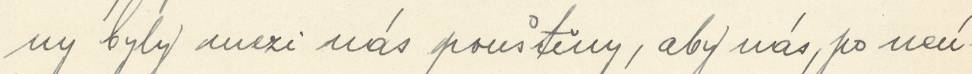ny byly mezi nás pouštěny, aby nás po neú-
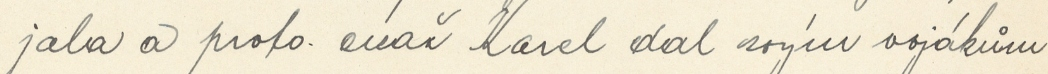jala a proto císař Karel dal svým vojákům
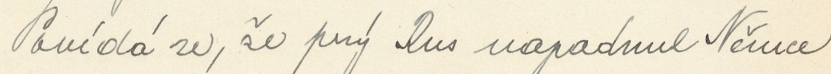Povídá se, že prý Rus napadnul Němce
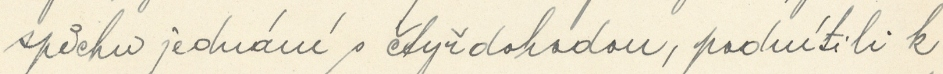spěchu jednání s čtyřdohodou, podnítili k
